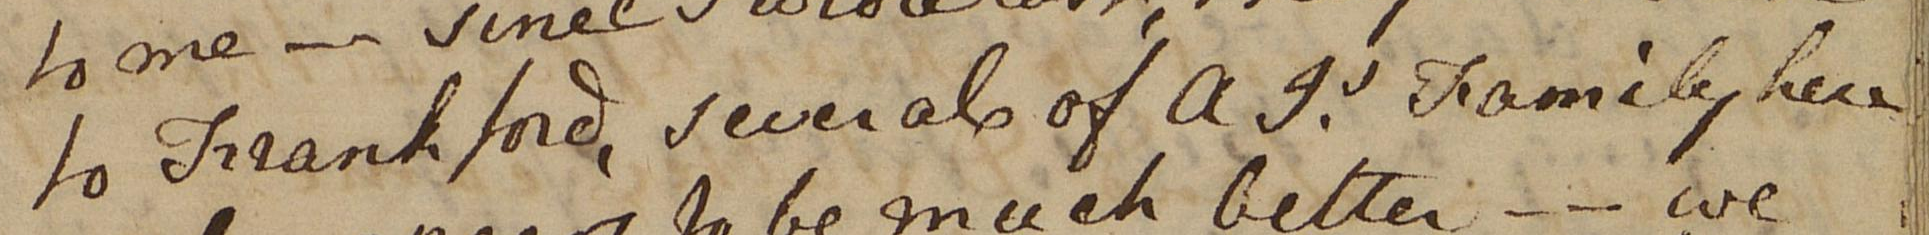to Frankford, several of AJ^s Family here
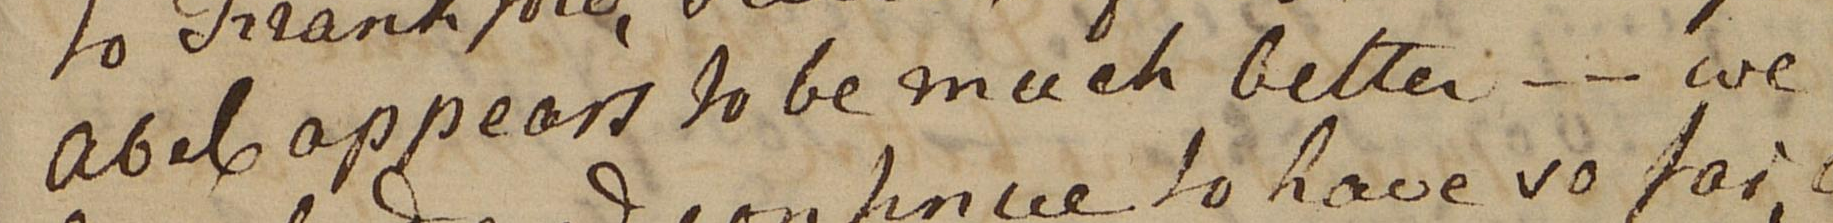Abel appears to be much better-- we
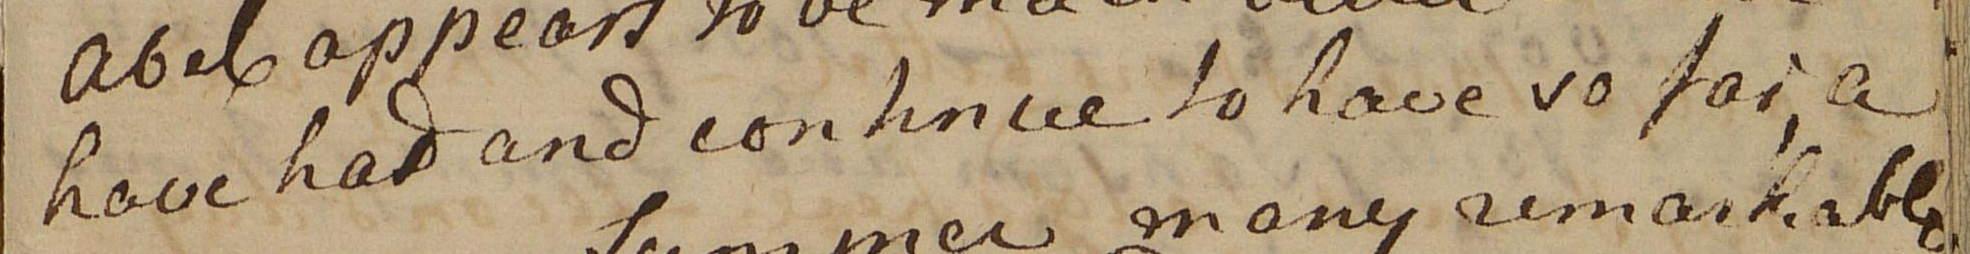have had and continue to have so far a
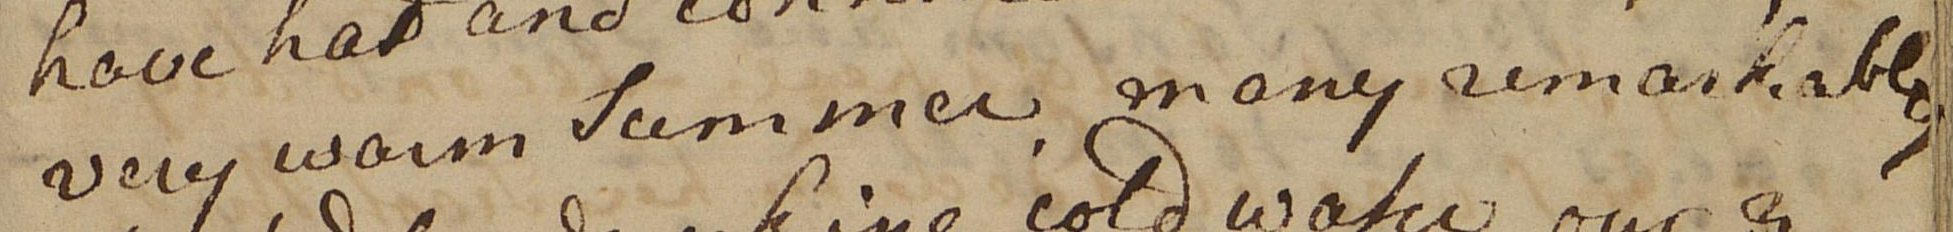very warm Summer many remarkably
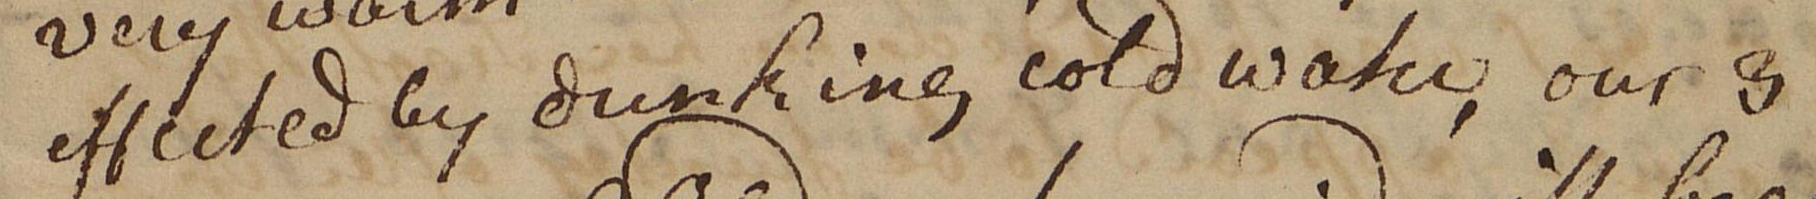effected by drinking cold water, our 3
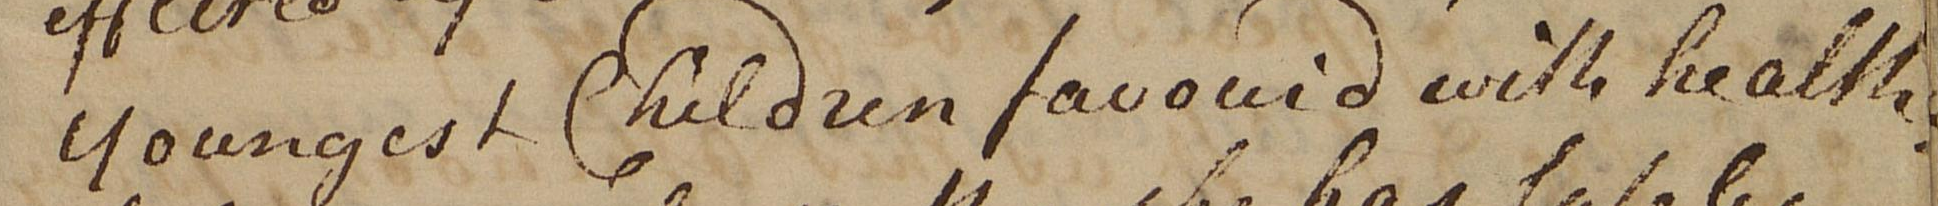Youngest Children favour'd with health
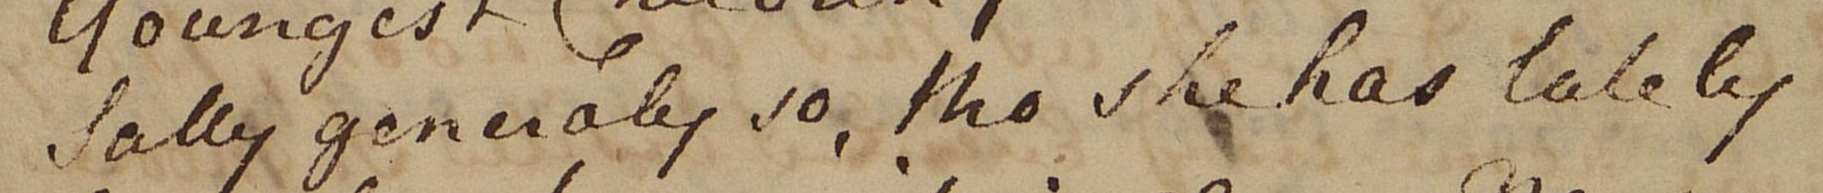Sally generaly 10, tho she has lately
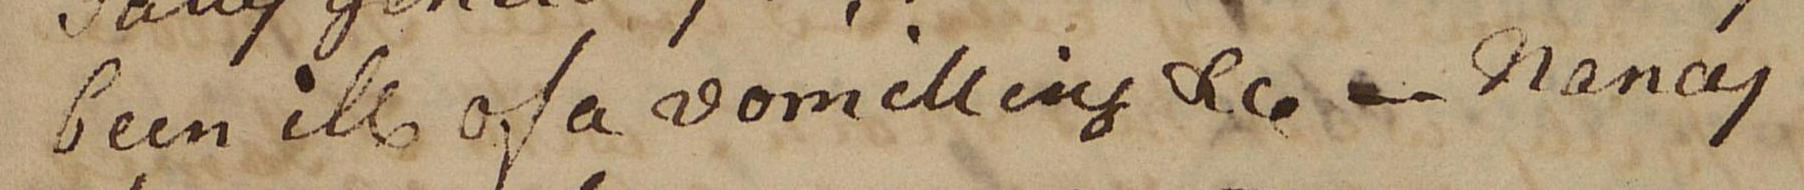been ill of a vomitting &c- Nancy
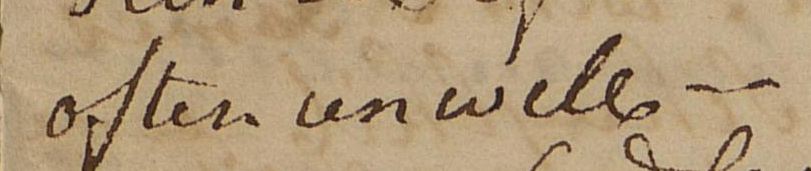often unwell-
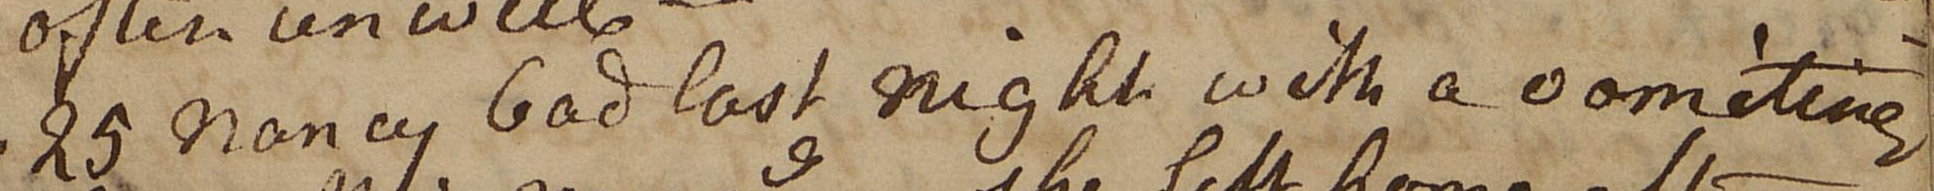25 Nancy bad last night with a vomiting
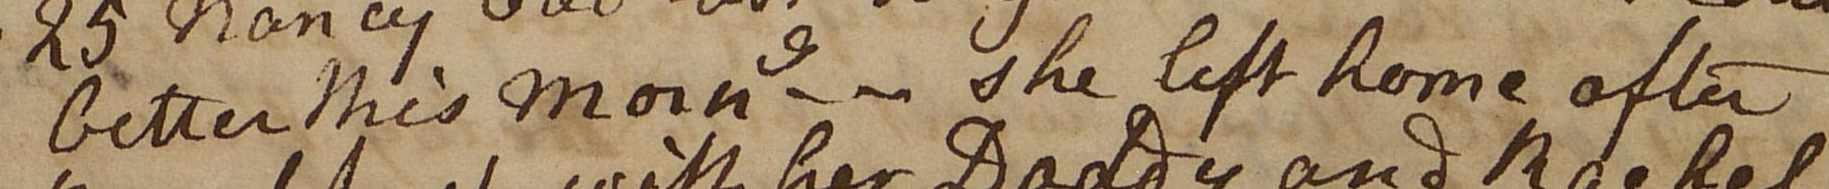better this morn^g-- she left home after
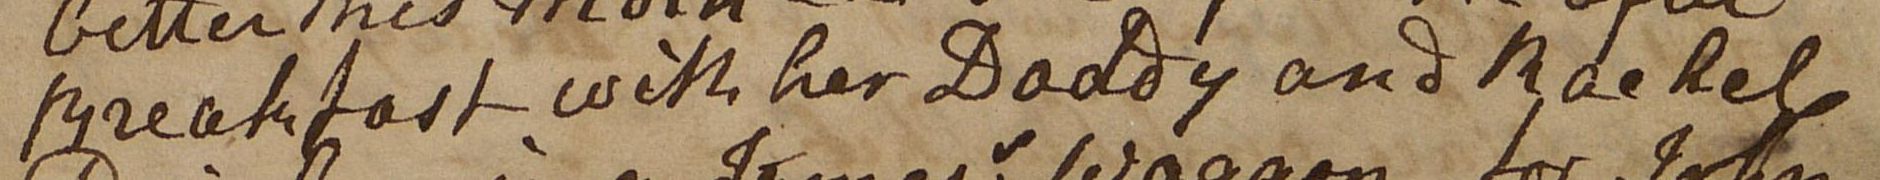Breakfast with her Daddy and Rachel
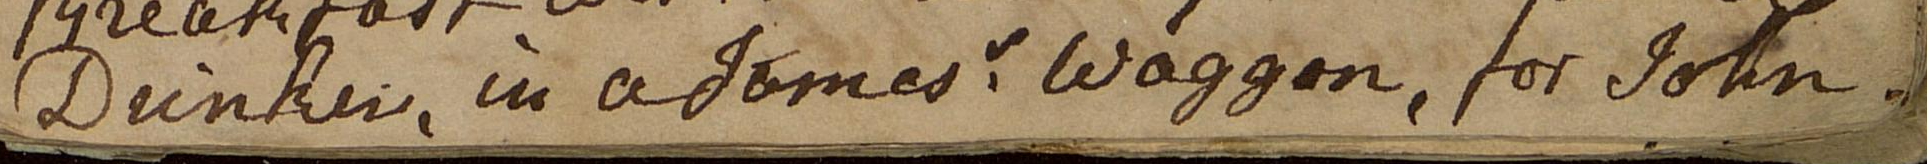Drinker, in a James^s. Waggon, for John.
